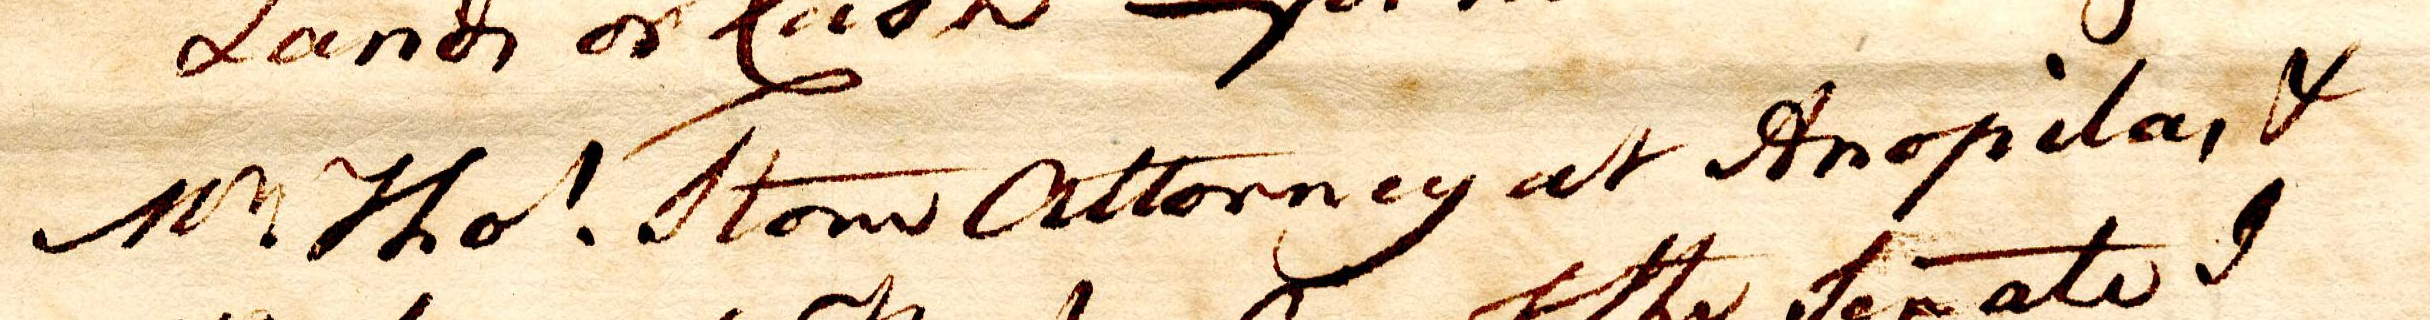M^r. Tho^s. Stows Attorney at Anopila, &
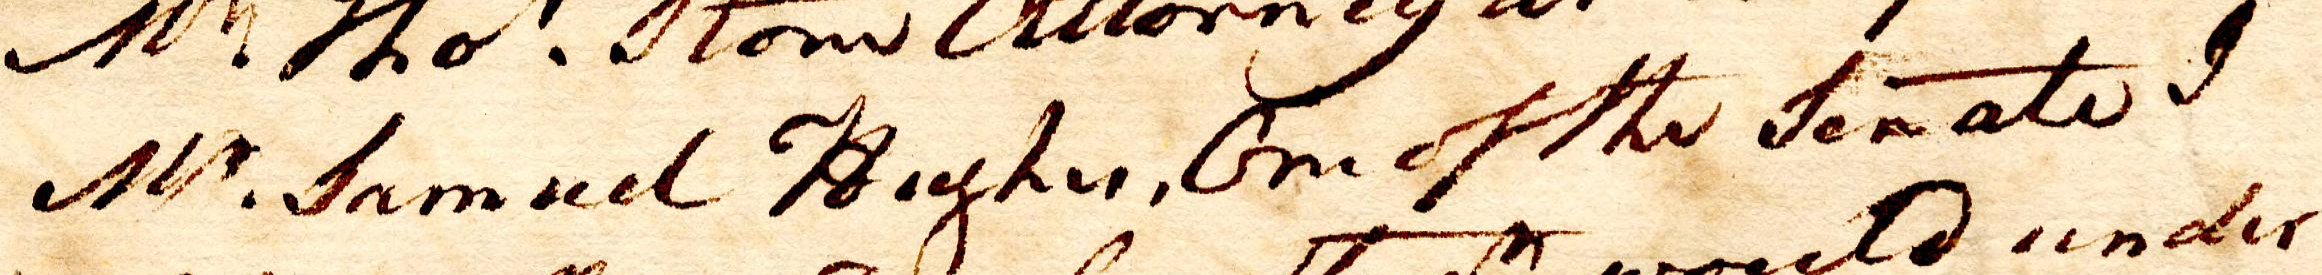M^r. Samuel Hughes, One of the Senate &
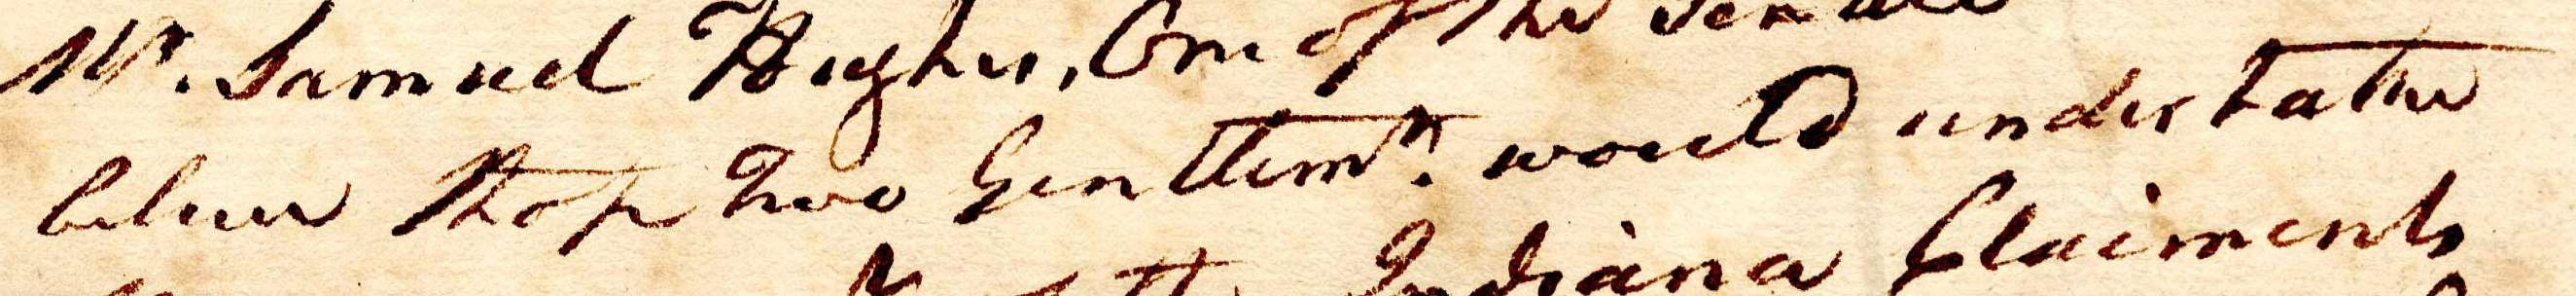belive those Two Gentlem^n. would undertake
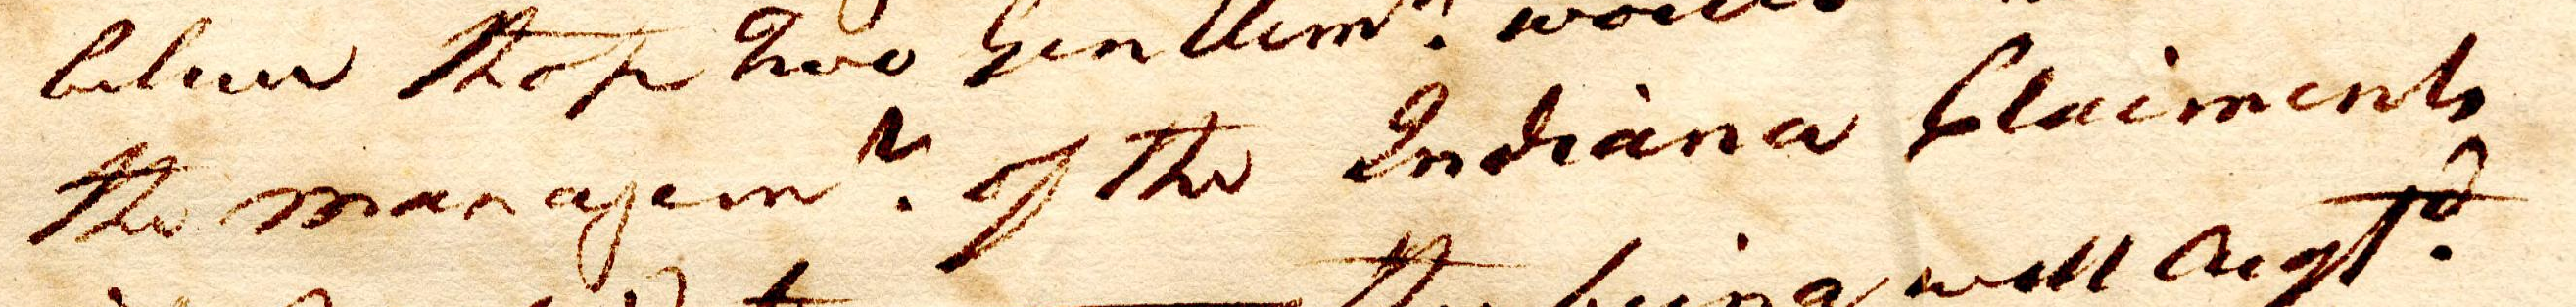the managem^ of the Indiana Claimants
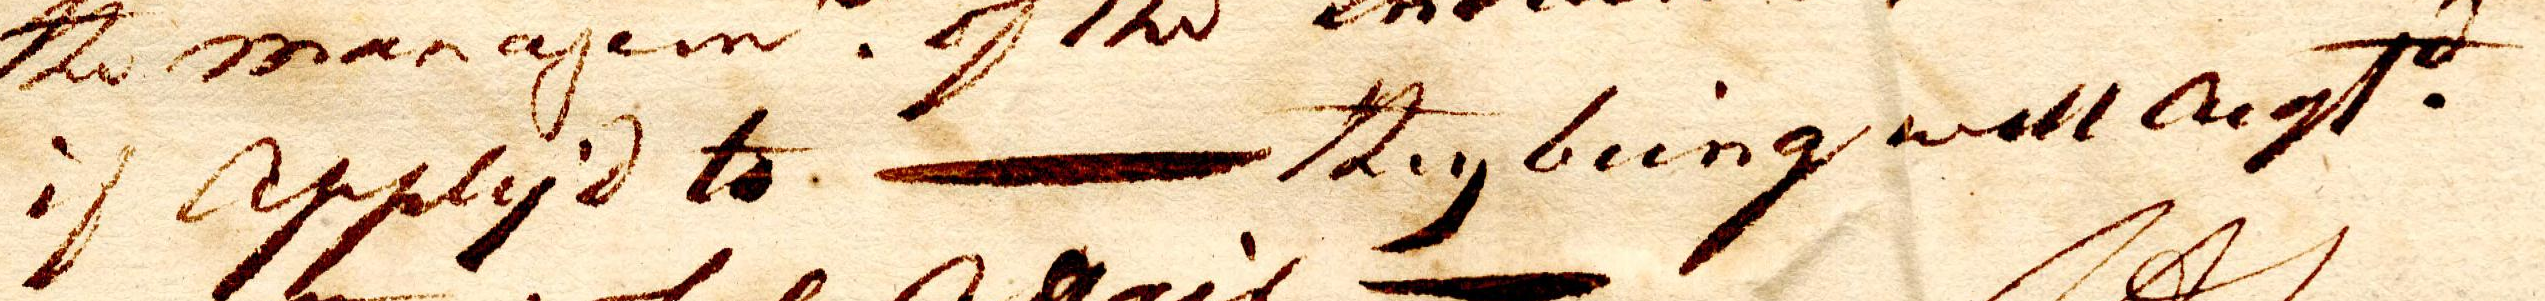if Apply'd to- they being well acqt^d
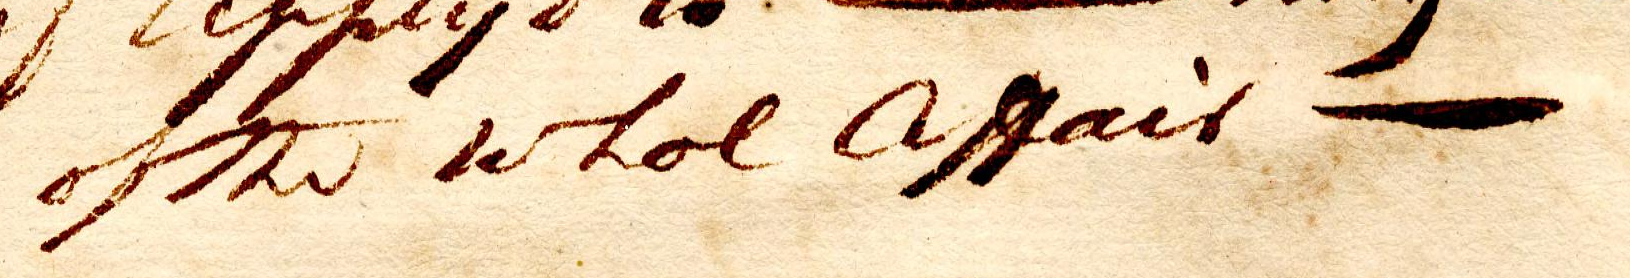of the whole Affair.-
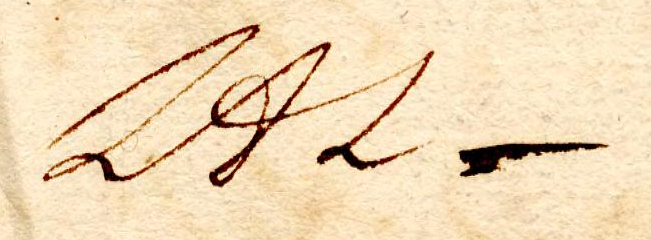AL-
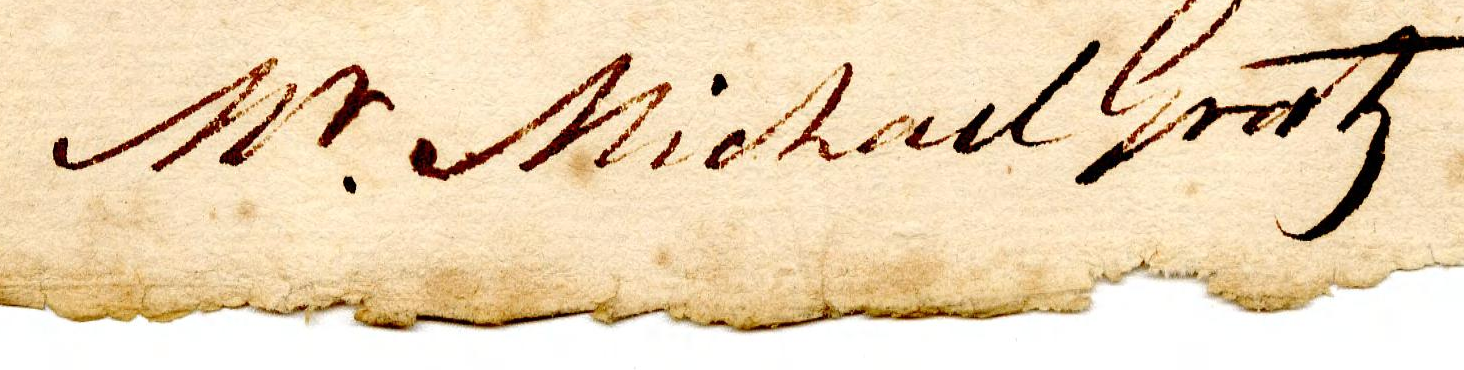M^r. Michael Gratz
